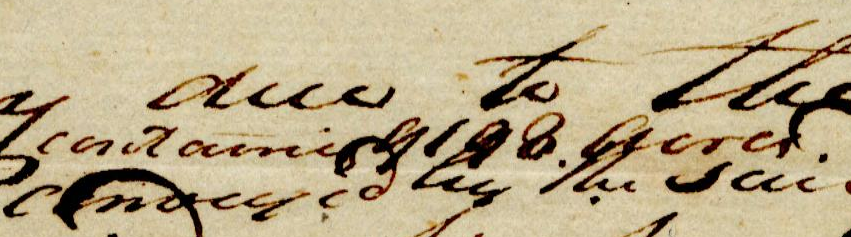containing 9198 acres
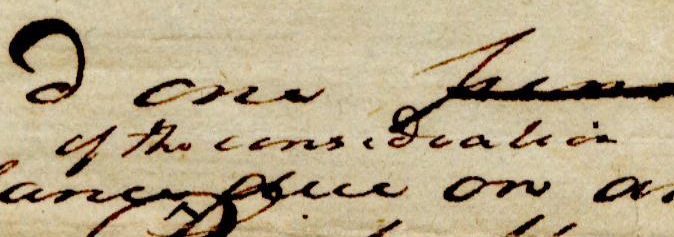of the consideration
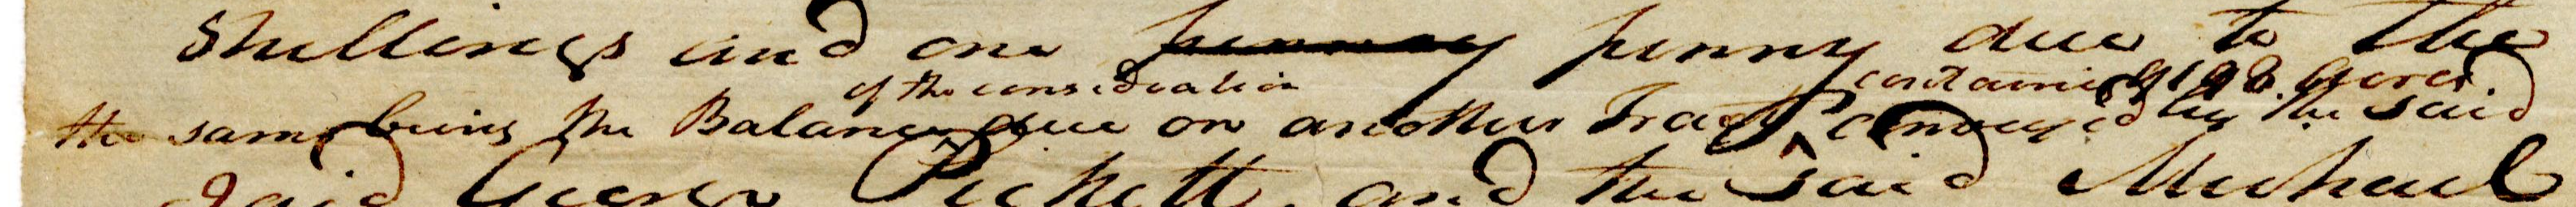the same being the Balance ^ due on another Tract ^ conveyed by the said
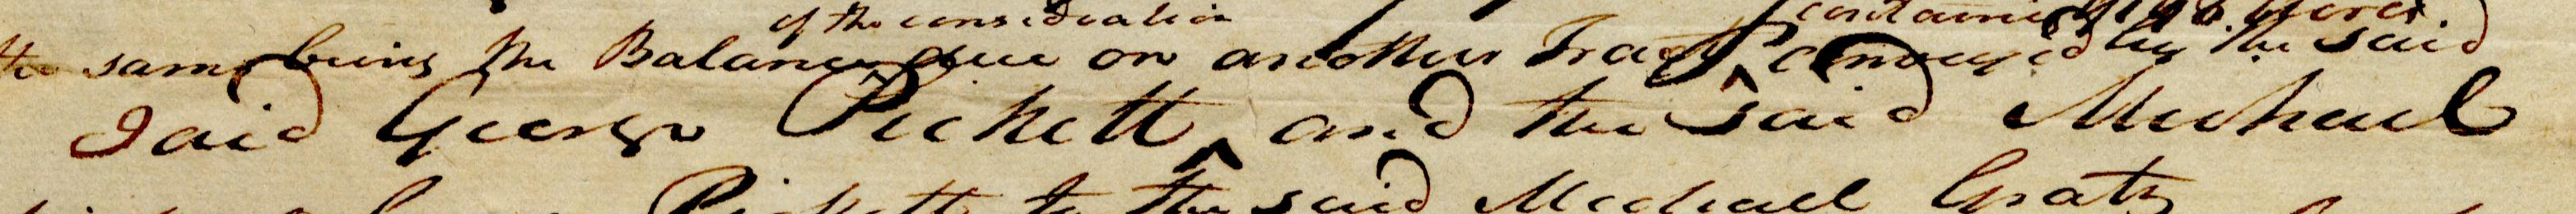said George Pickett ^ and tersuid Michael
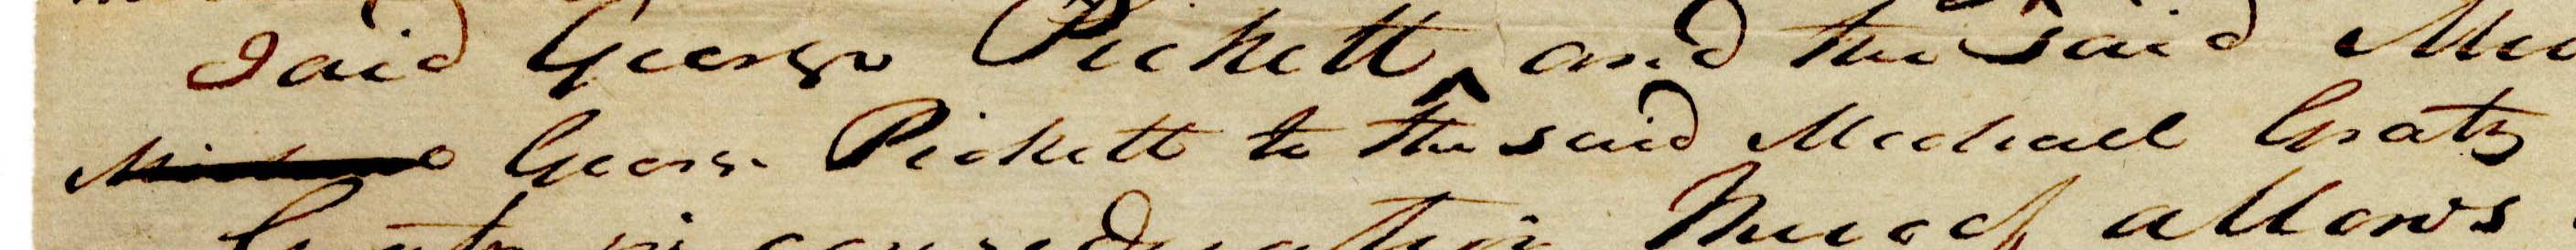[Michael] George Pickett to the said Michael Gratz
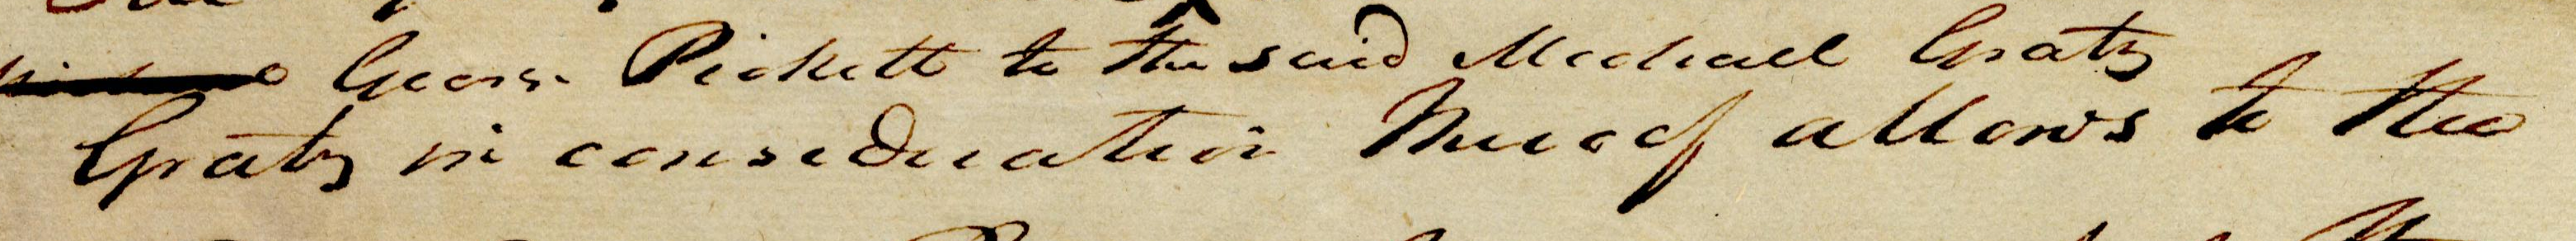Gratz in consideration thereof allows to the
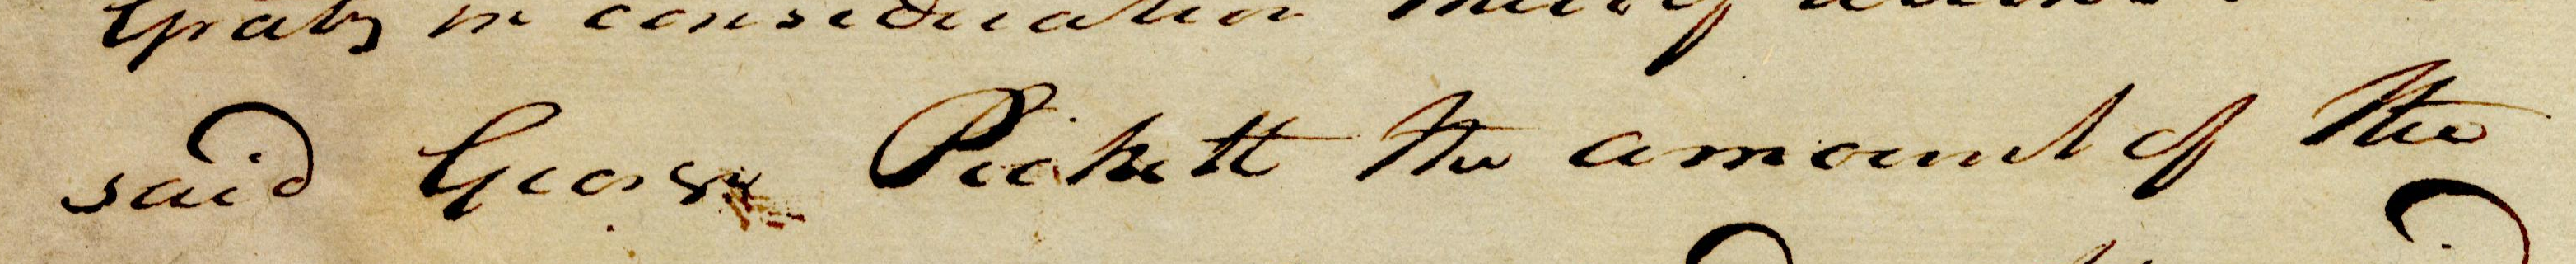said George Pickett the amount of the
